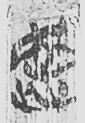奔
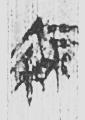秦
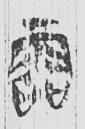霝
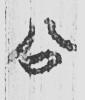公
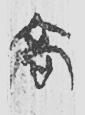高
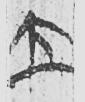立
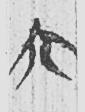六
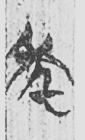年
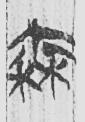秦
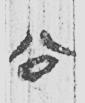公
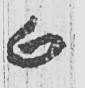㠯（以）
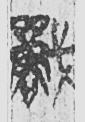戰
